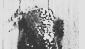刖
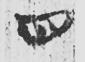四
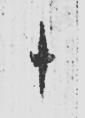十
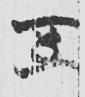五
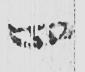四
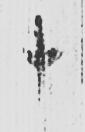十
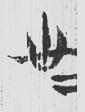卅=
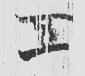五
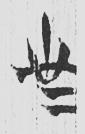卅=
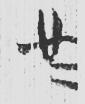廿=
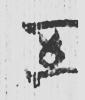五
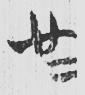廿=
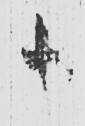十
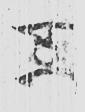五
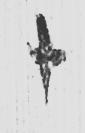十
